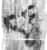女（如）
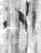又（有）
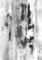俤（弟）
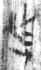必
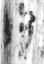死
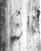㠯（以）
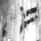亡
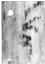貨
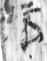不
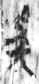爯（稱）
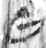㠯（以）
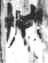巤（獵）
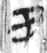田
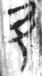邑
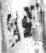○（吝）
